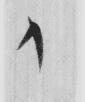人
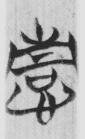情
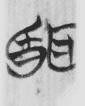䎽
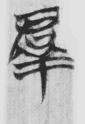羣
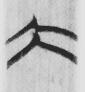大
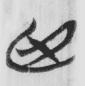臣
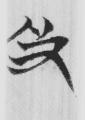及
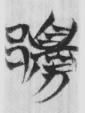{臱阝}
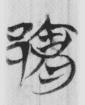{邑宀占肉}
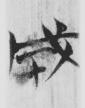成
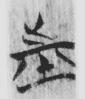市
